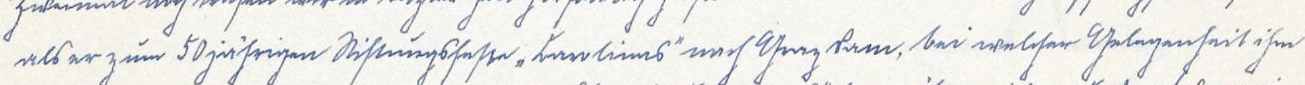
als er zum 50jährigen Stiftungsfeste „Carolinas“ nach Graz kam, bei welcher Gelegenheit ihm
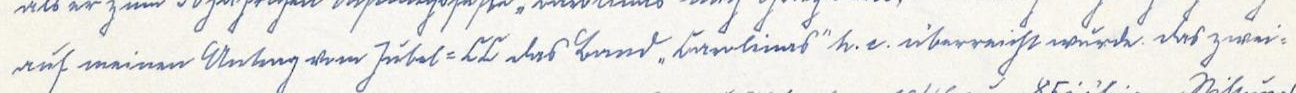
auf meinen Antrag vom Jubel-CC das Band „Carolinas“ h. c. überreicht wurde. Das zwei-
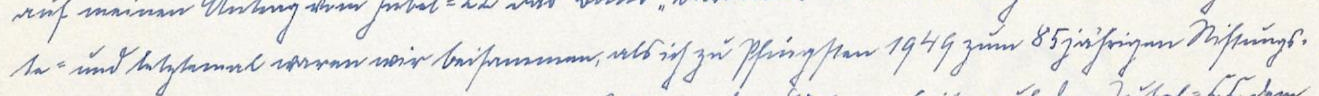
te - und letzte Mal waren wir beisammen, als sich zu Pfingsten 1949 zum 85jährigen Stiftungs-
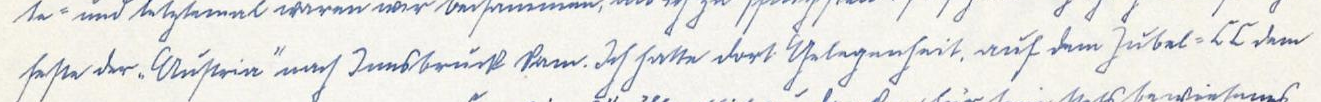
feste der „Austria! nach Innsbruck kann. Ich hatte dort Gelegenheit auf dem Jubel-CC dem
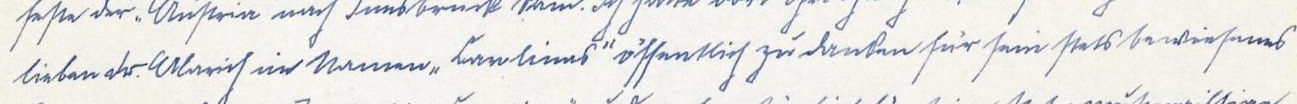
lieben Dr. Alarich im Namen „Carolinas“ öffentlich zu danken für sein stets bewiesenes
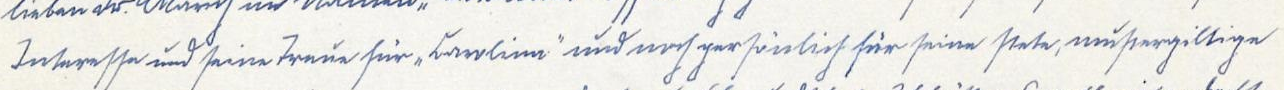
Interesse und seine Treue für „Carolina“ und noch persönlich für seine stete, mustergültige
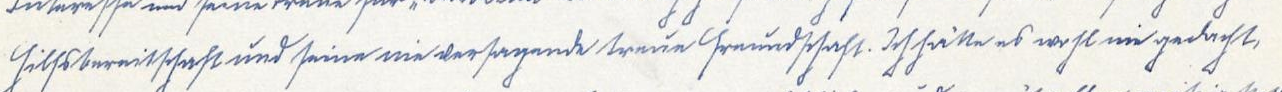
Hilfsbereitschaft und seine mir nie versagende treue Freundschaft. Ich hätte es wohl nie gedacht,
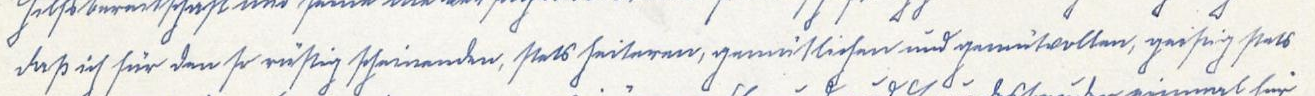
daß ich für den so rüstig scheinenden, stets heiteren, gemütlichen und gemütsvollen, geistig stets
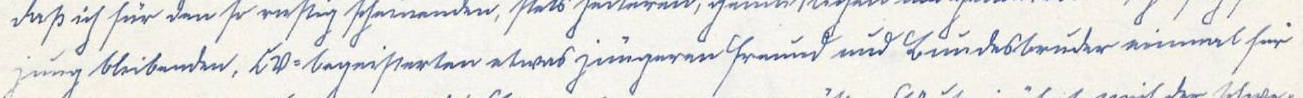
jung bleibenden, CV-begeisterten etwas jüngeren Freund und Bundesbruder einmal für
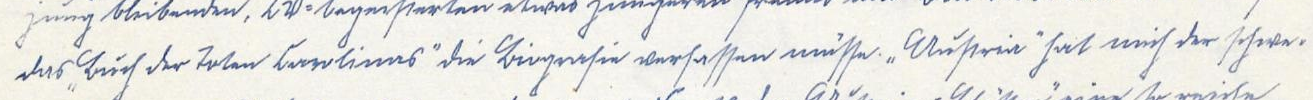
das !Buch der Toten Carolinas“ die Biografie verfassen müsste. „Austria“ hat mich der schwe-
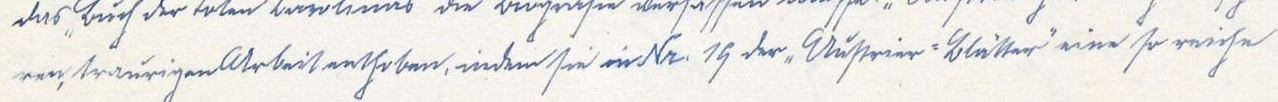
ren, traurigen Arbeit enthoben, indem sie in Nr 19 der „Austrier-Blätter“ eine so reiche
